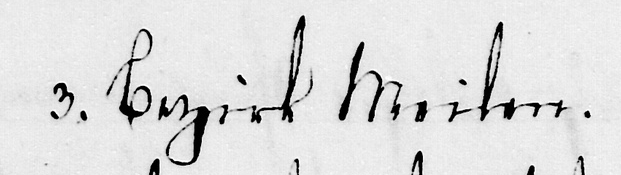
3. Bezirk Meilen.
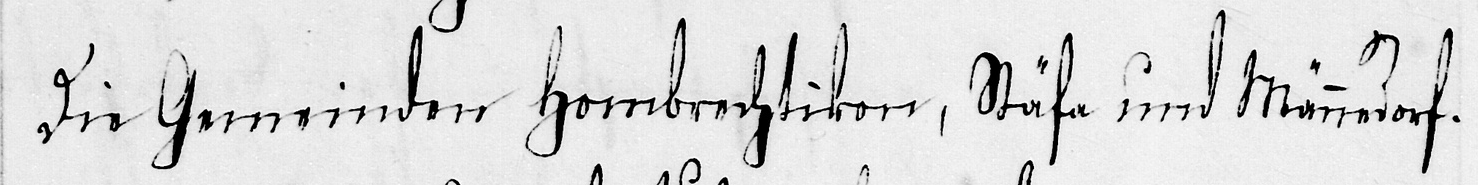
Die Gemeinden Hombrechtikon, Stäfa und Männedorf.
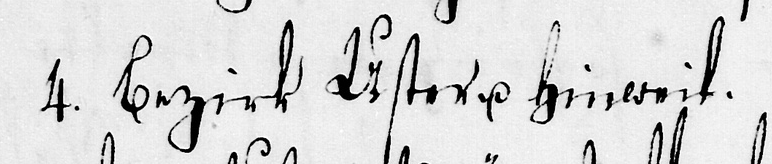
4. Bezirk Uster u. Hinweil.
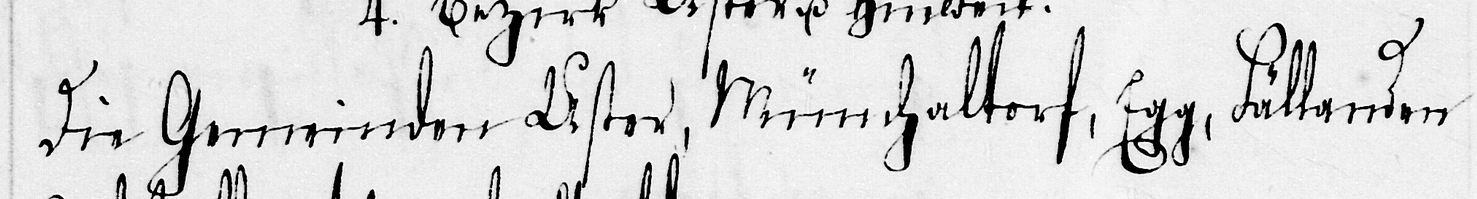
Die Gemeinden Uster, Münchaltorf, Egg, Fällanden
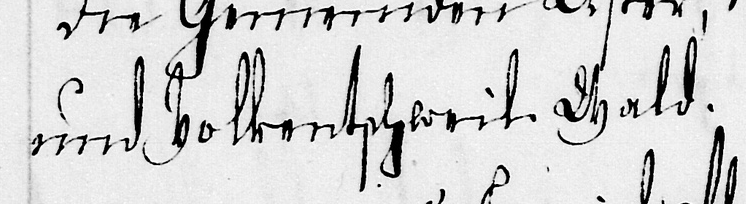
und Volkentschweil, Wald.
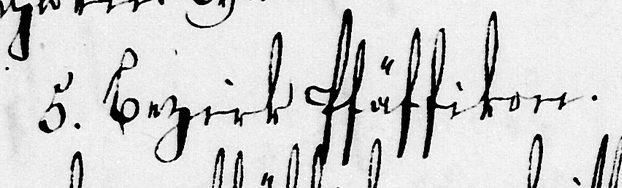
5. Bezirk Pfäffikon.
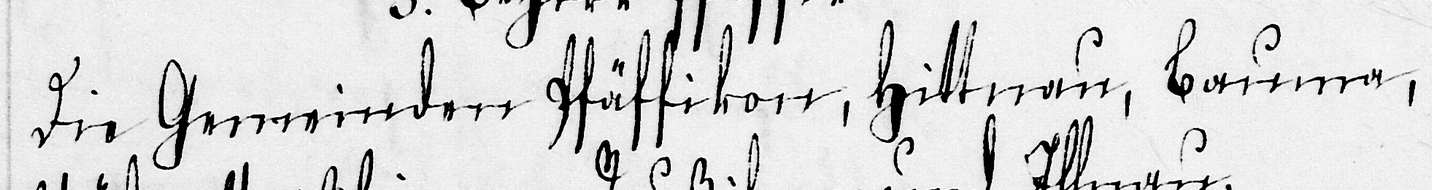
Die Gemeinden Pfäffikon, Hittnau, Bauma,
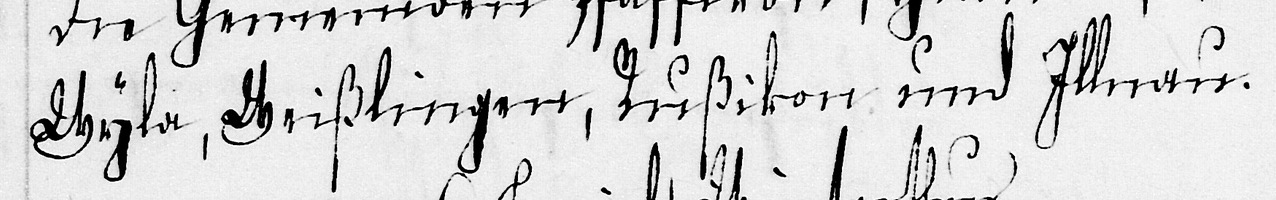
Wyla, Weißlingen, Rußikon und Illnau.
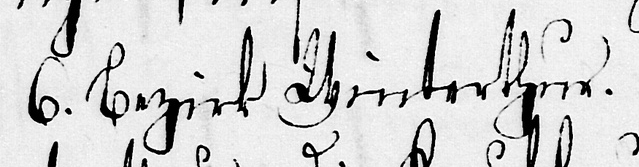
6. Bezirk Winterthur.
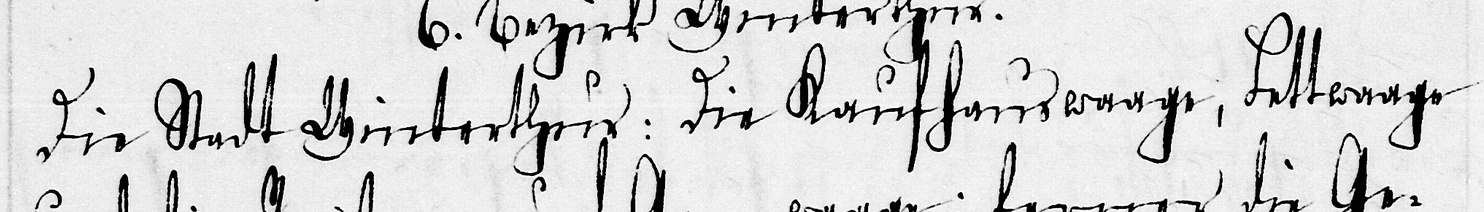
Die Stadt Winterthur: Die Kaufhauswaage, Fettwaage
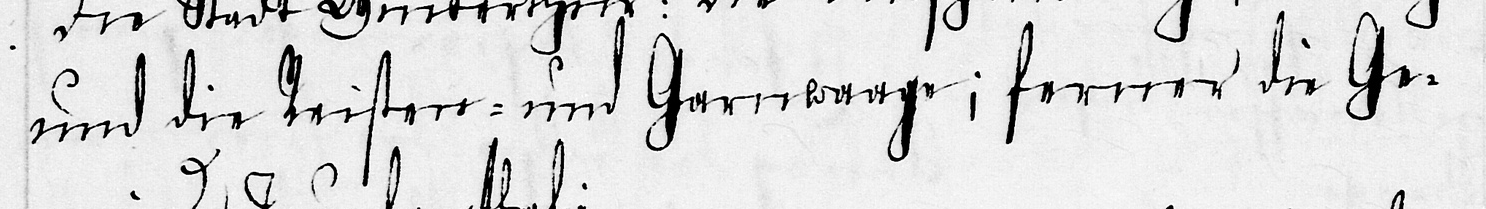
und die Reisten- und Garnwaage; ferner die Ge¬
